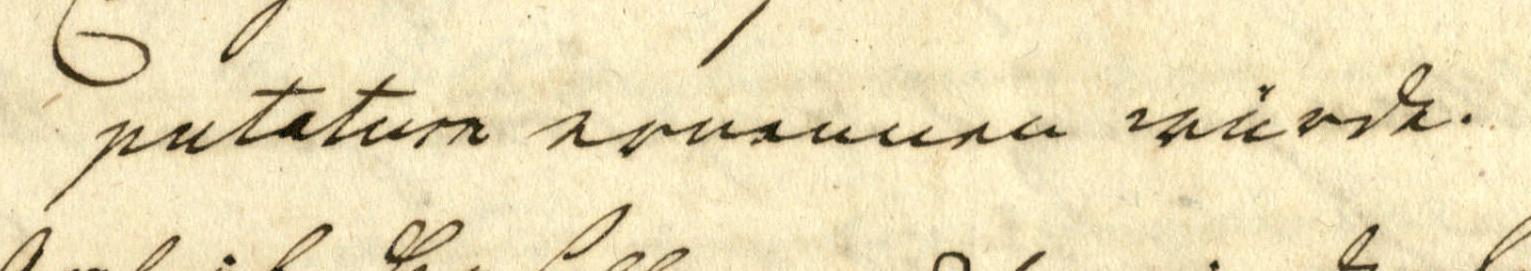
putatum ernennen würde.
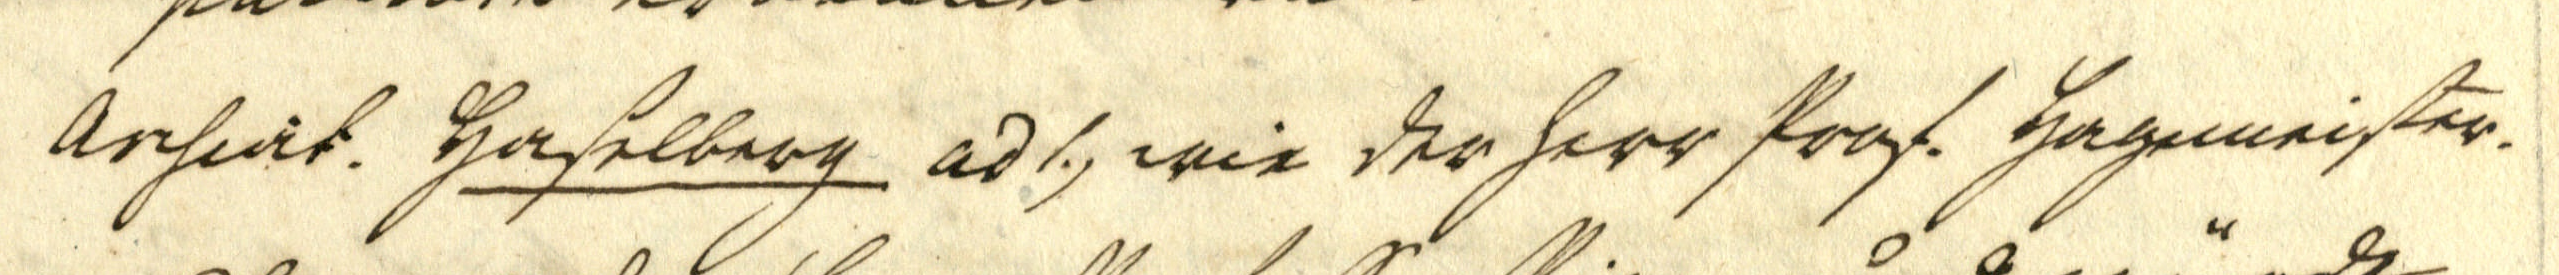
Archiat. Haselberg ad 1, wie der Herr Prof. Hagemeister.
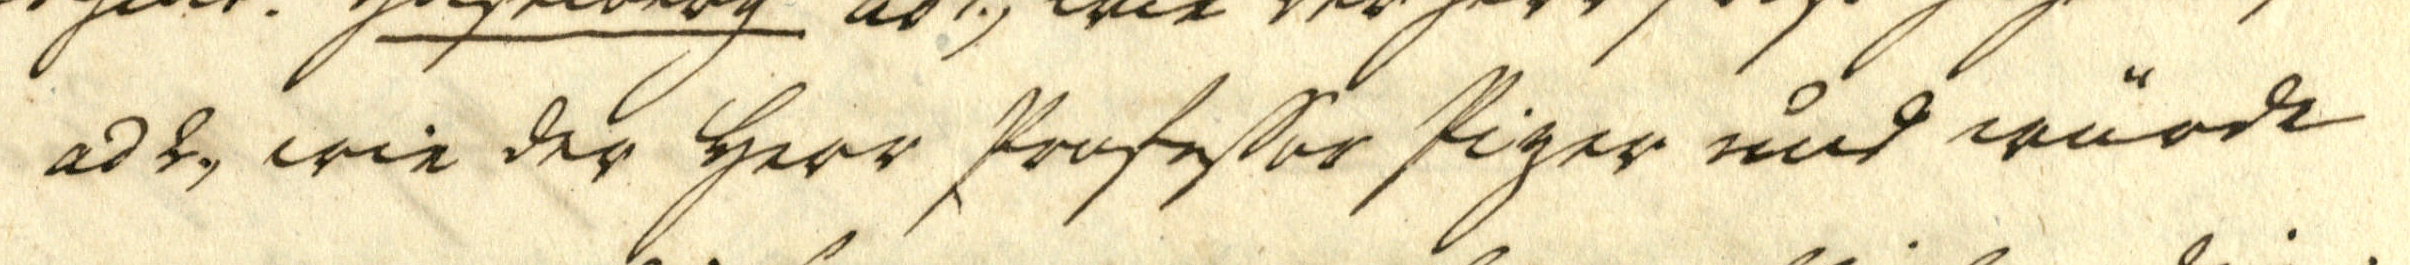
ad 2., wie der Herr Professor Piper und würde
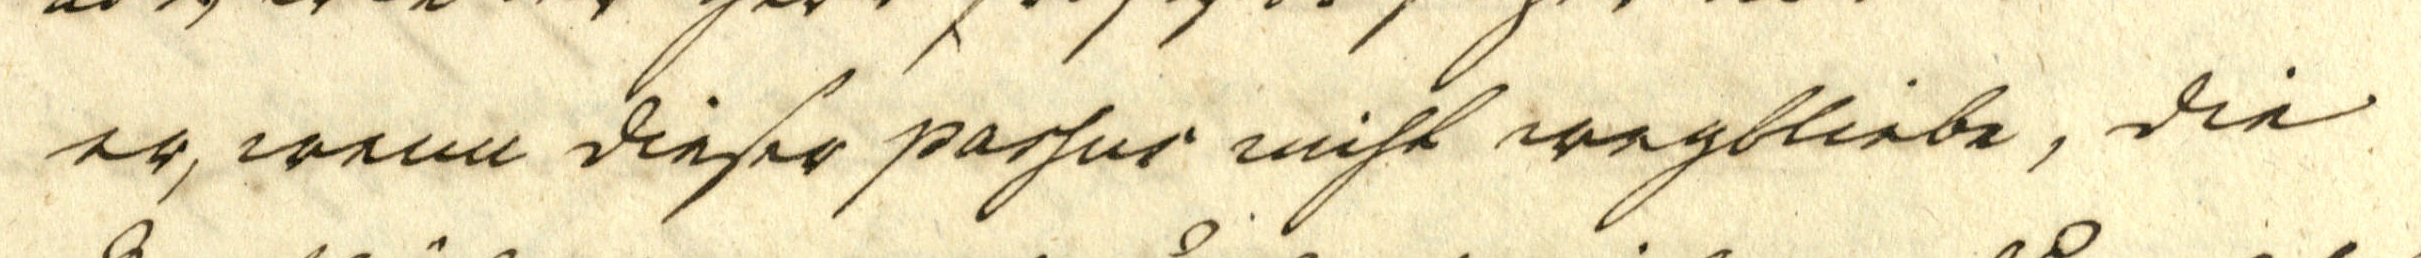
er, wenn dieser passus nicht wegbliebe, die
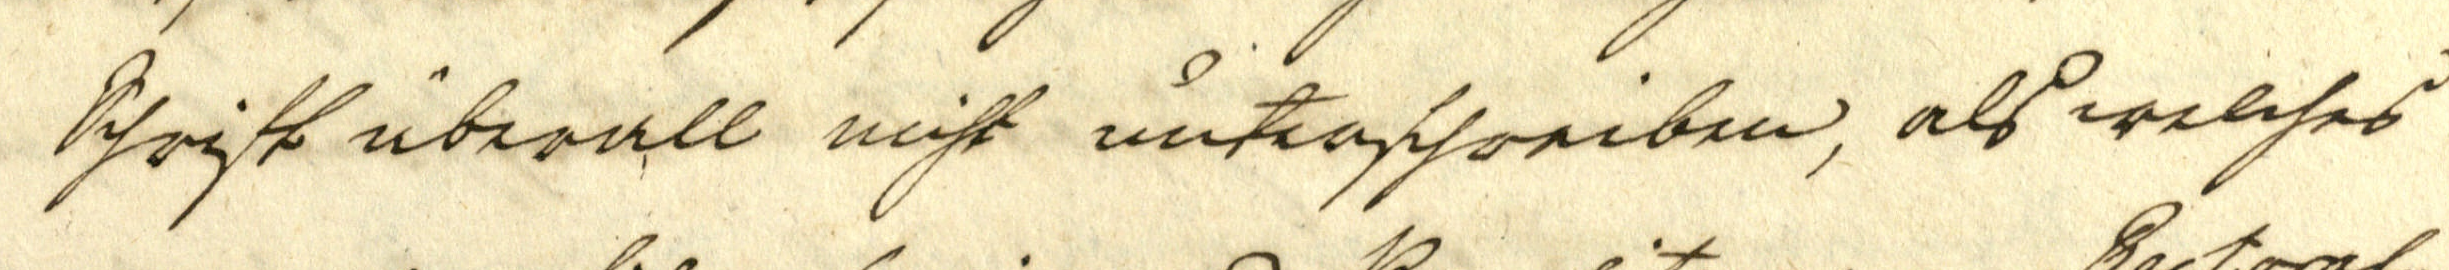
Schrift überall nicht unterschreiben, als welches
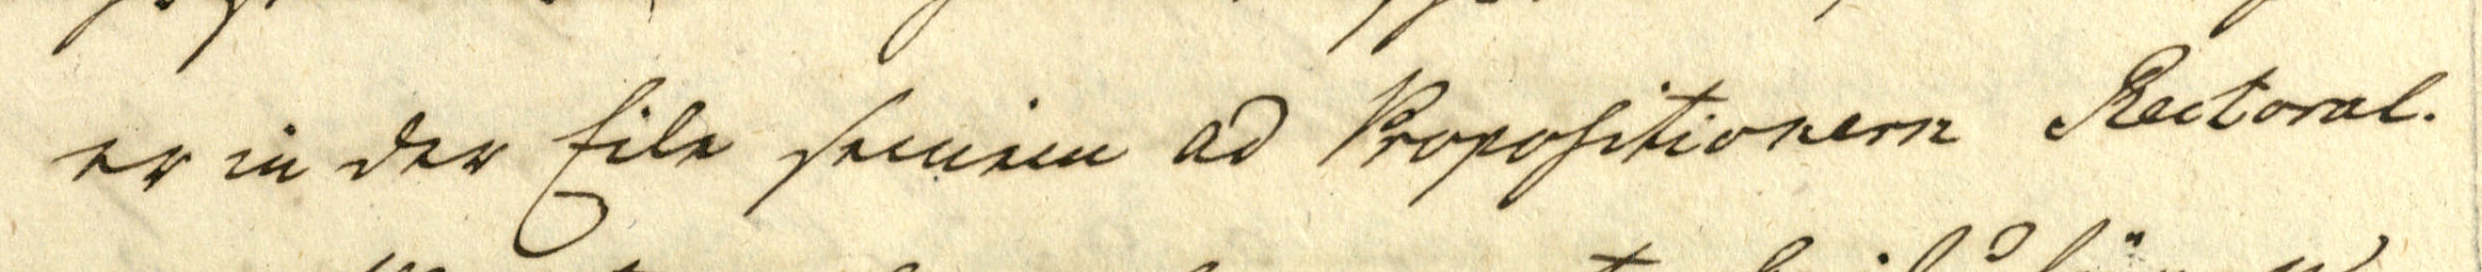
er in der Eile seinem ad Propositionem Rectoral.
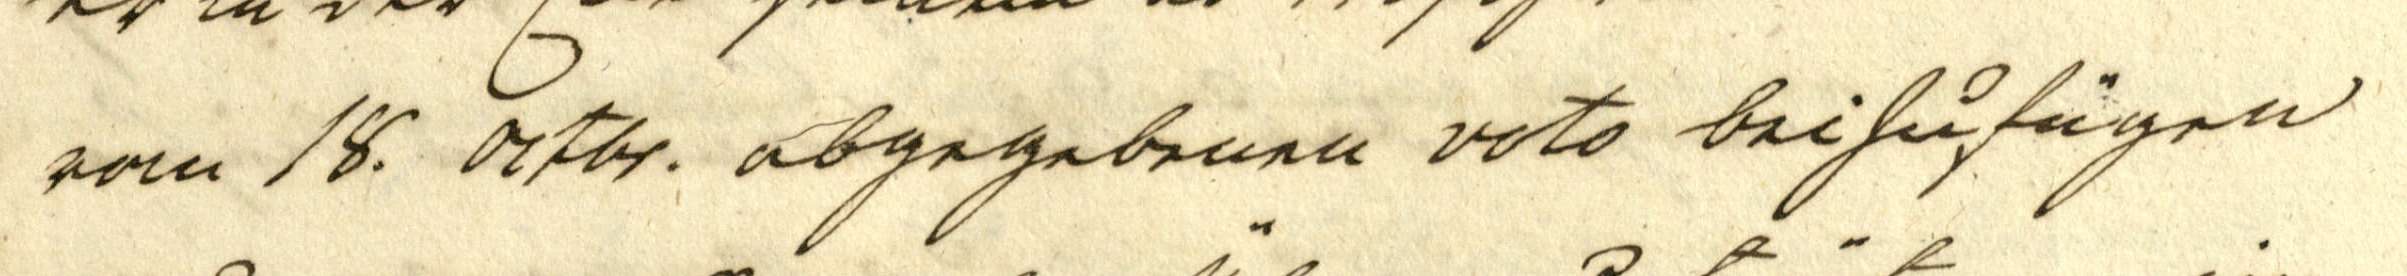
vom 18. Octbr. abgegebenen voto beizufügen
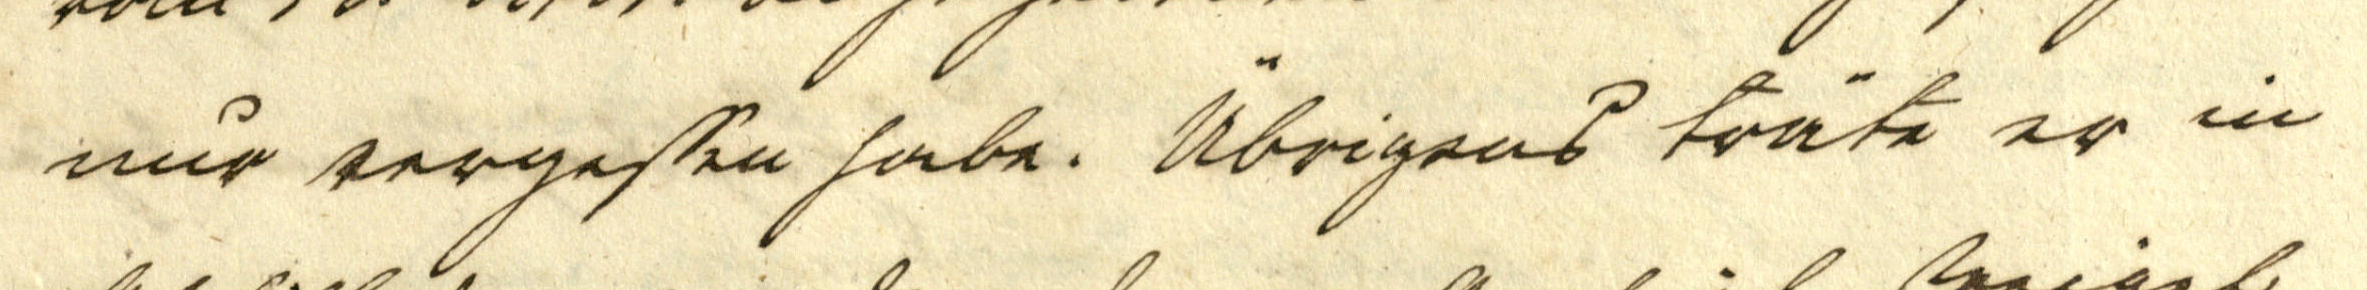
nur vergessen habe. Übrigens träte er in
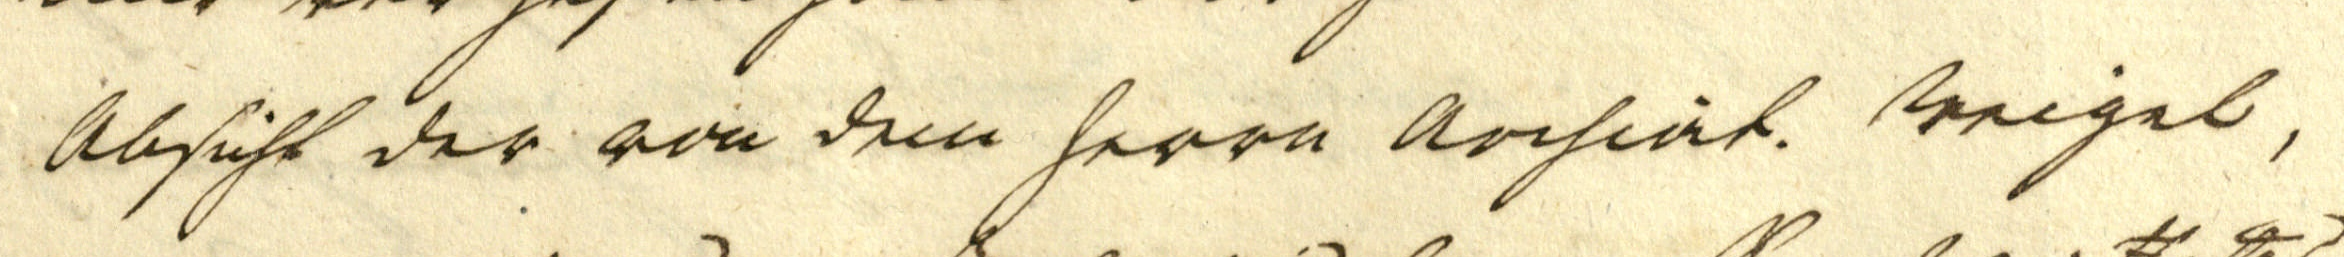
Absicht der von dem Herrn Archiat. Weigel,
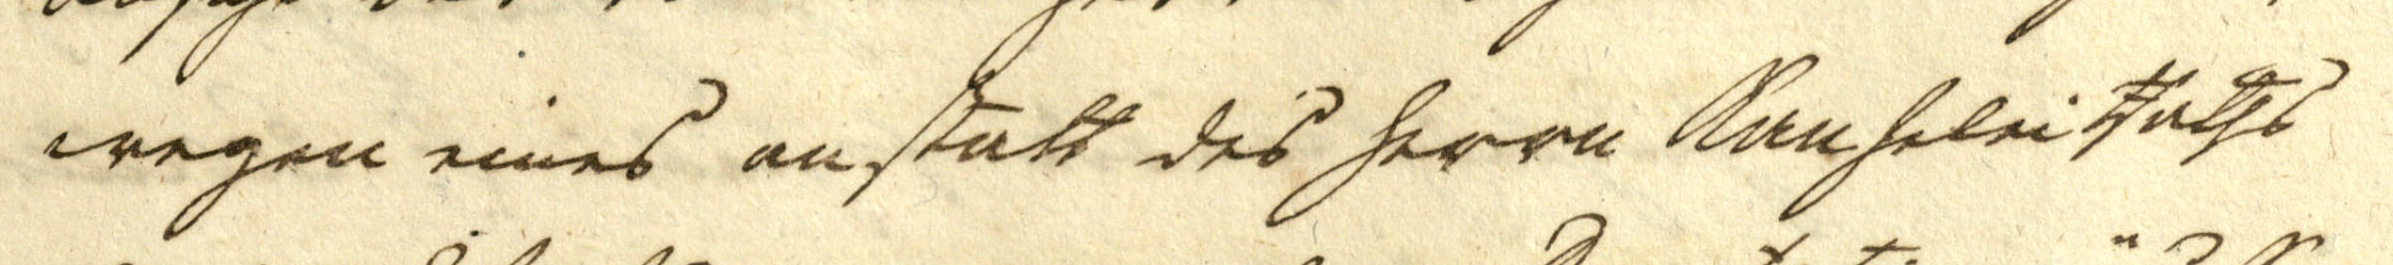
wegen eines anstatt des Herrn Kanzelei Raths
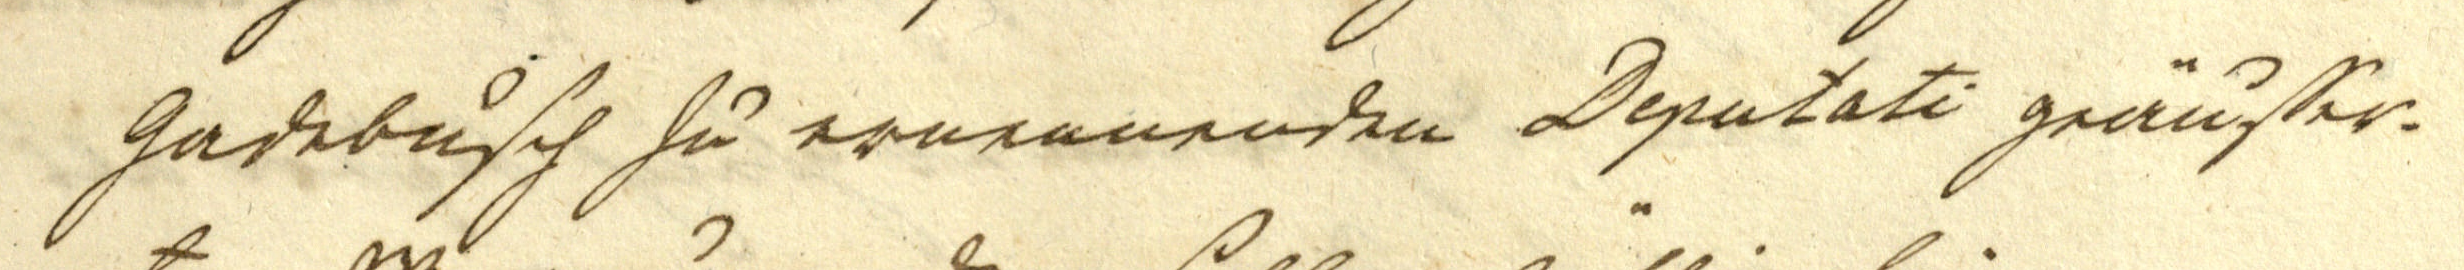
Gadebusch zu ernennenden Deputati geäusser¬
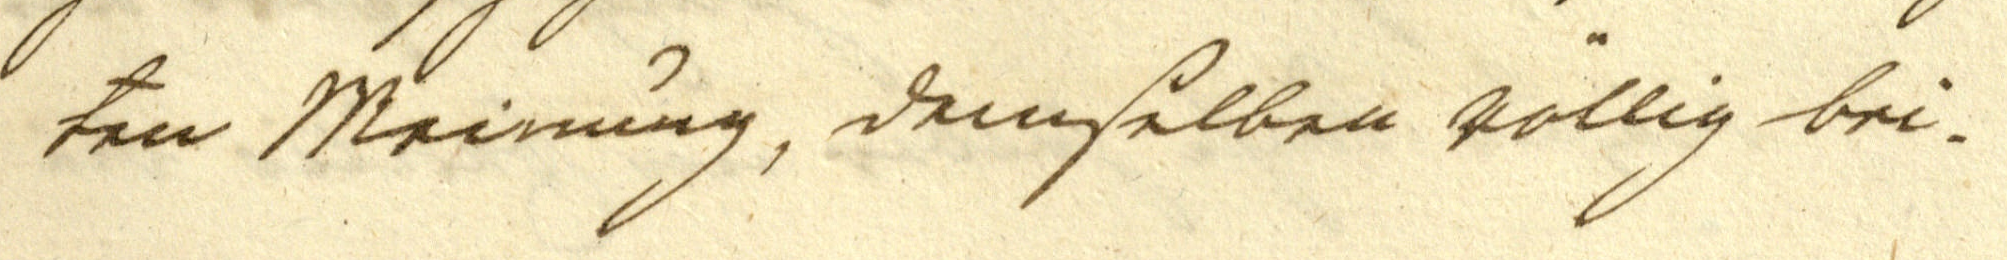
ten Meinung, demselben völlig bei.
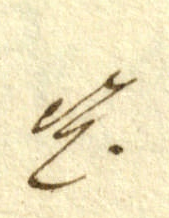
dh.
